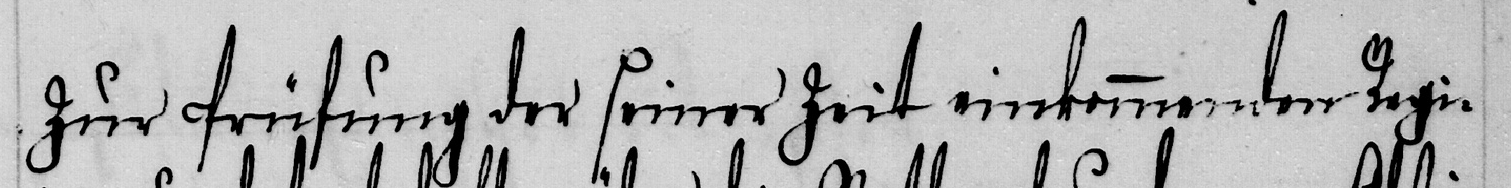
Zur Prüfung der seiner Zeit einkommenden Regi¬
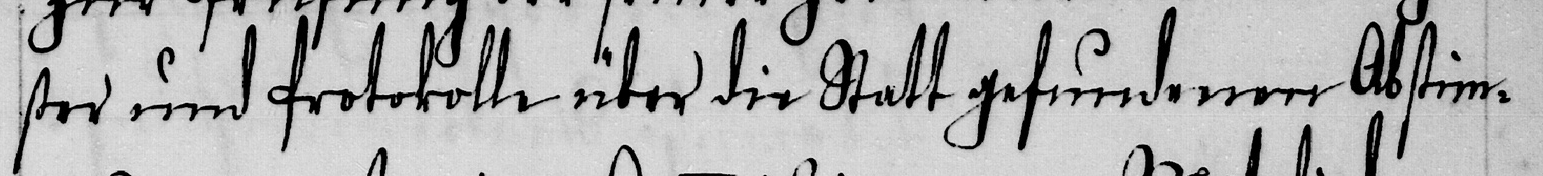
ster und Protokolle über die Statt gefundenen Abstim¬
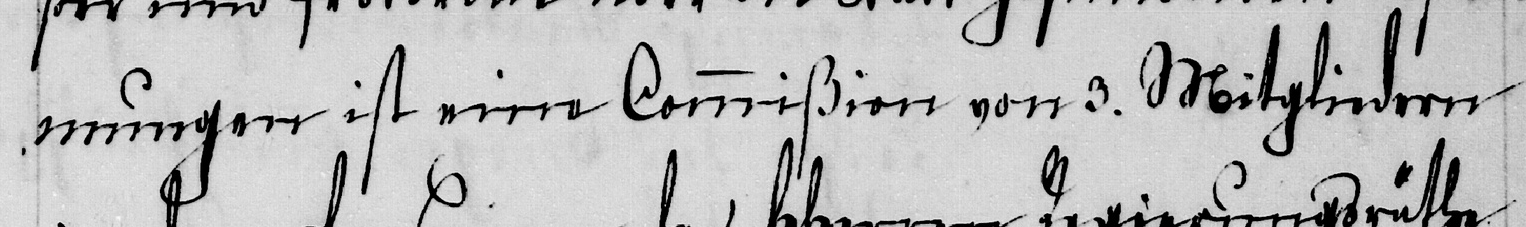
mungen ist eine Commißion von 3. Mitgliedern
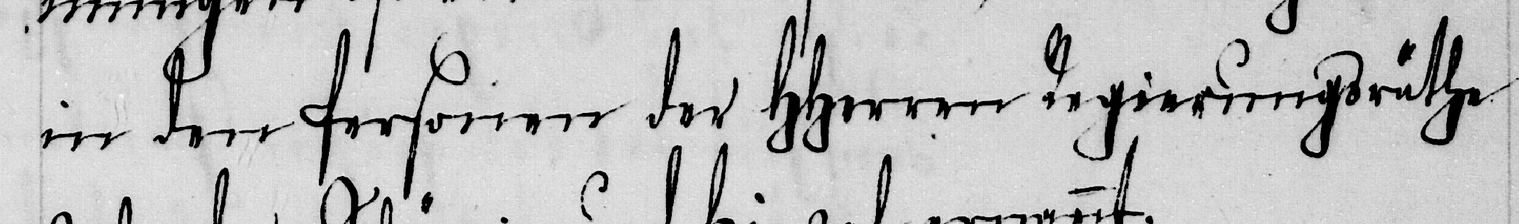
in den Personen der HHerrn Regierungsräthe
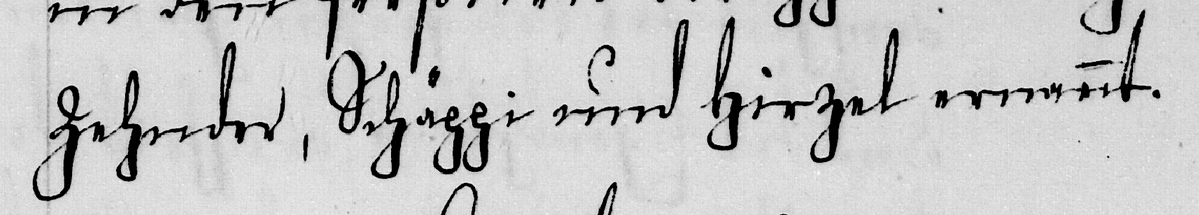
Zehnder, Schäppi und Hirzel ernannt.
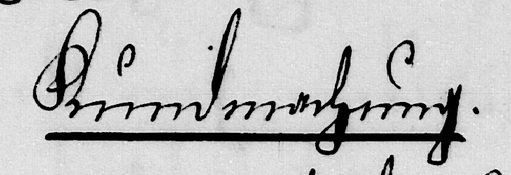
Kundmachung.
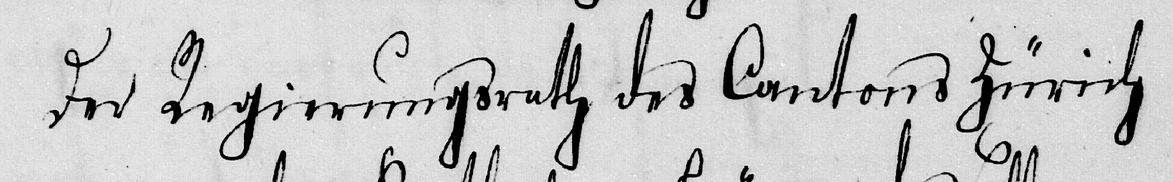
Der Regierungsrath des Cantons Zürich
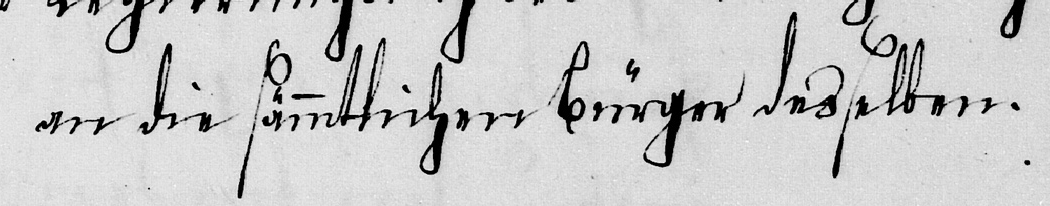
an die sämmtlichen Bürger desselben.
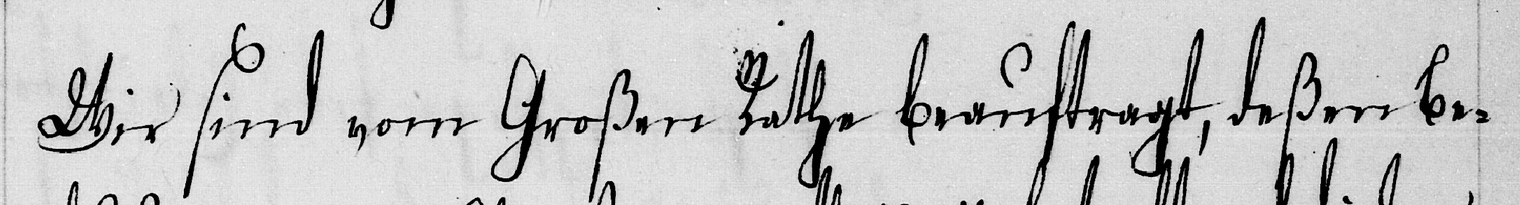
Wir sind vom Großen Rathe beauftragt, deßen Be¬
